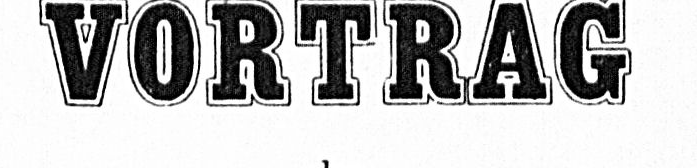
VORTRAG
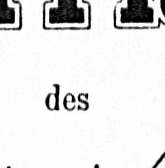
des
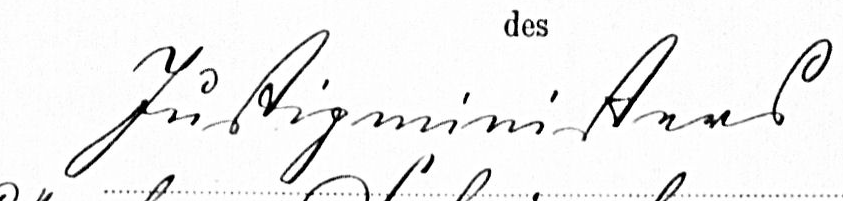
Justizministers
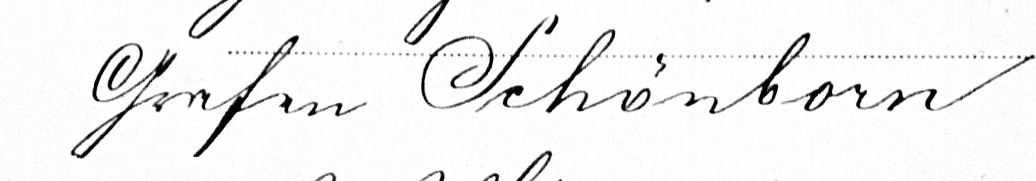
Grafen Schönborn
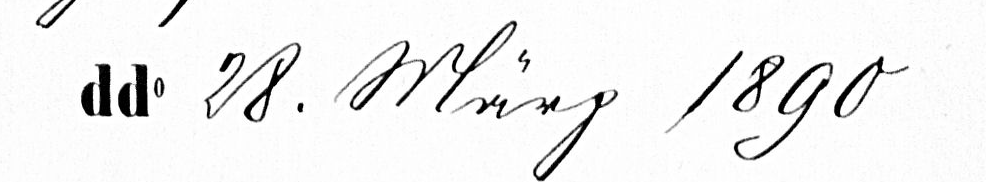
dd° 28. März 1890
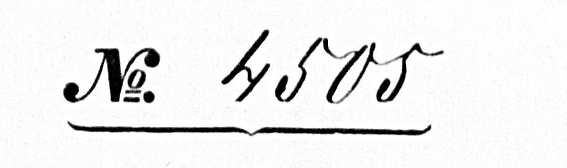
N° 4505
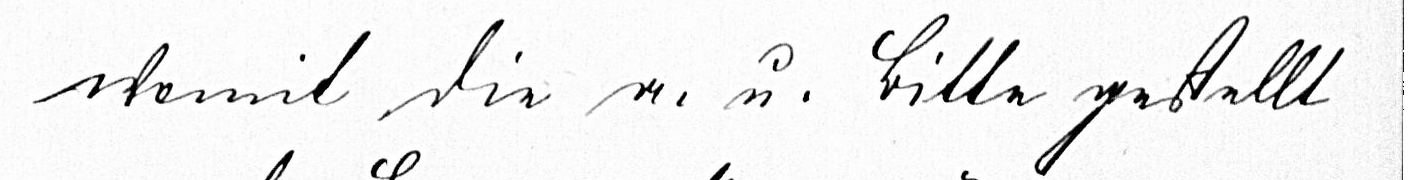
womit die a. u. Bitte gestellt
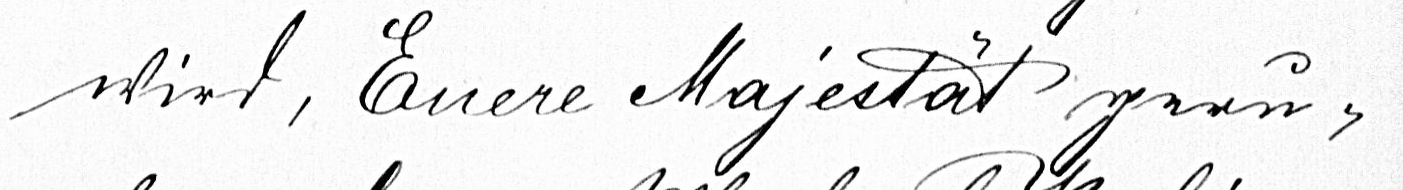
wird, Euere Majestät geru¬
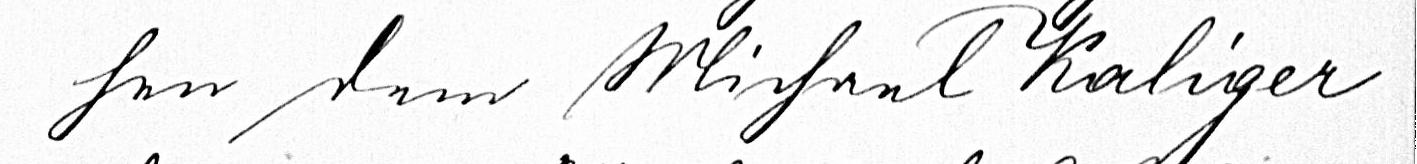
hen dem Michael Kaliger
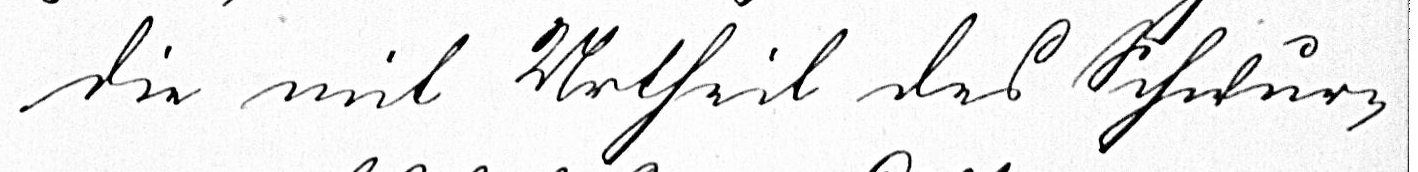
die mit Urtheil des Schwur¬
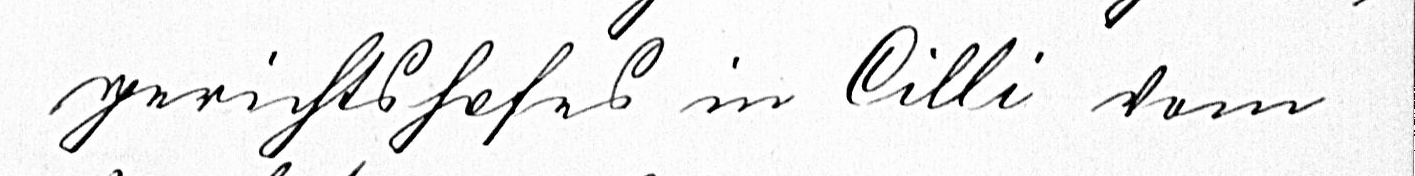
gerichtshofes in Cilli vom
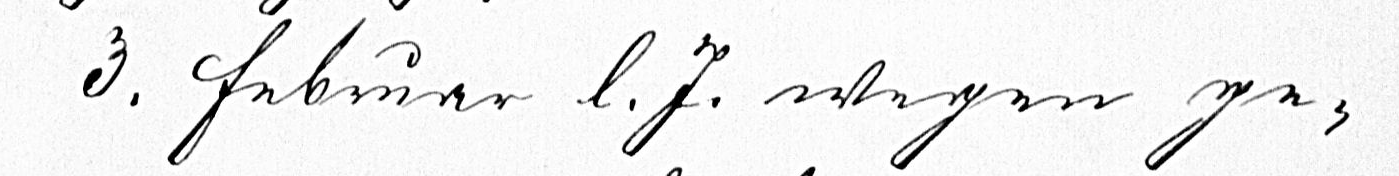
3. Februar l.J. wegen ge¬
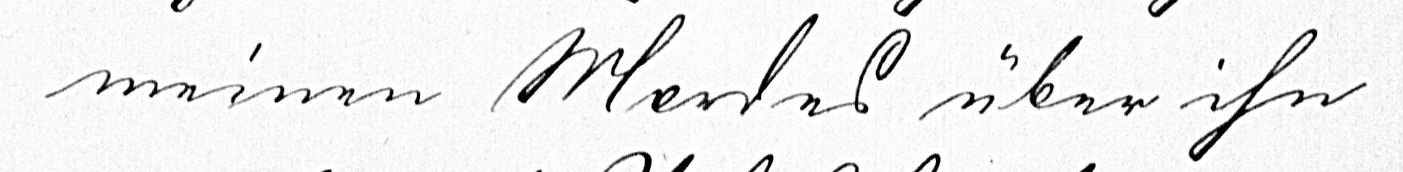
meinen Mordes über ihn
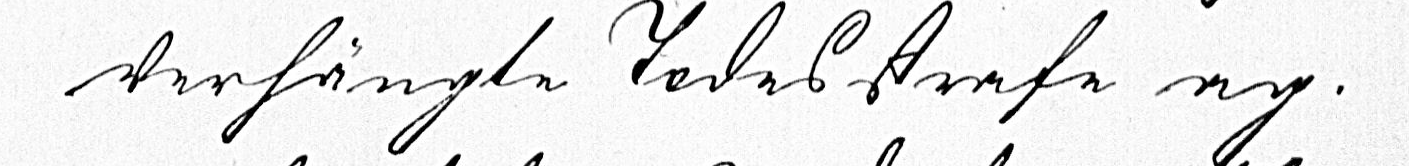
verhängte Todesstrafe ag.
